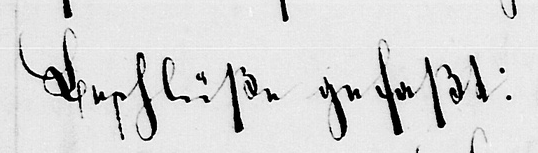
Beschlüße gefaßt:
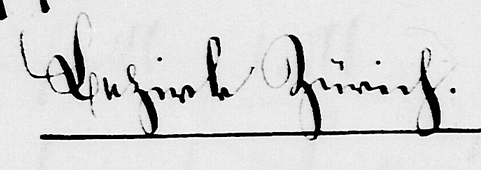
Bezirk Zürich.
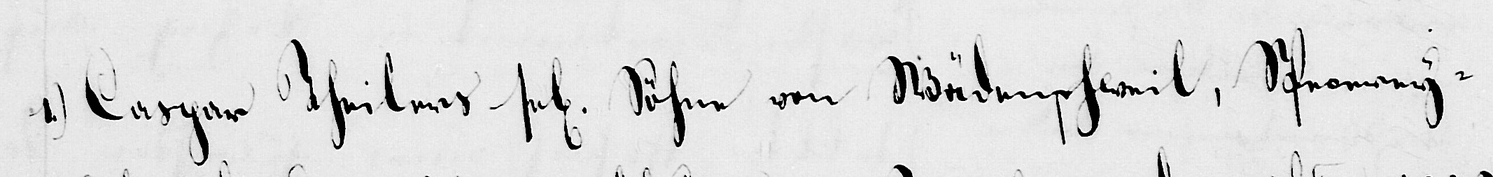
1.) Caspar Theilers sel[ig] Söhne von Wädenschweil, Specerey-
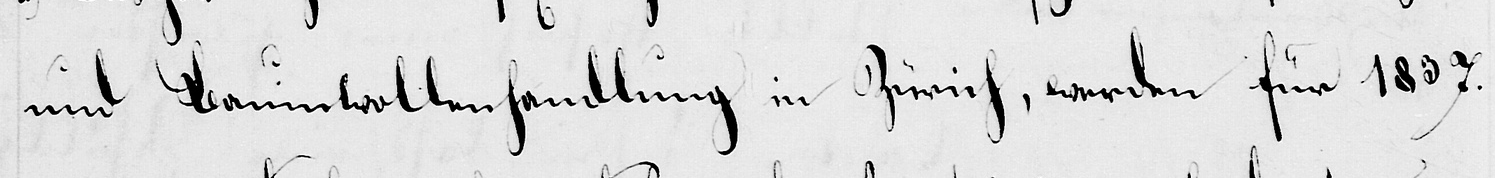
und Baumwollenhandlung in Zürich, werden für 1837.
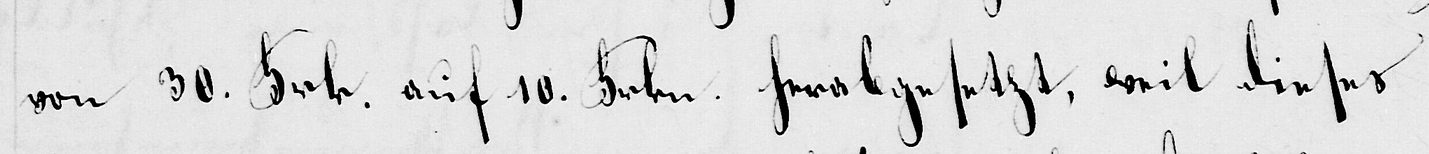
von 30. Frk. auf 10. Frkn. herabgesetzt, weil dieses
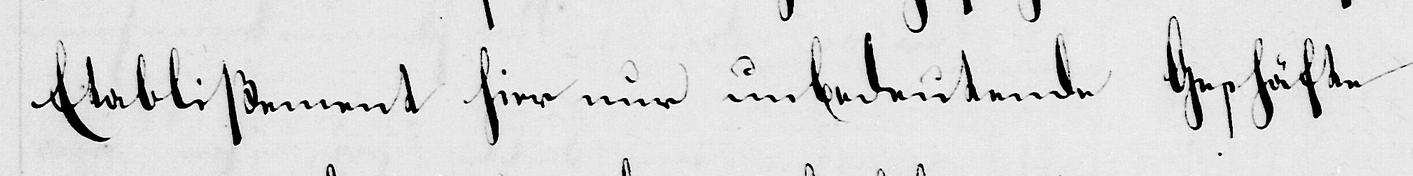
Etablißement hier nur unbedeutende Geschäfte
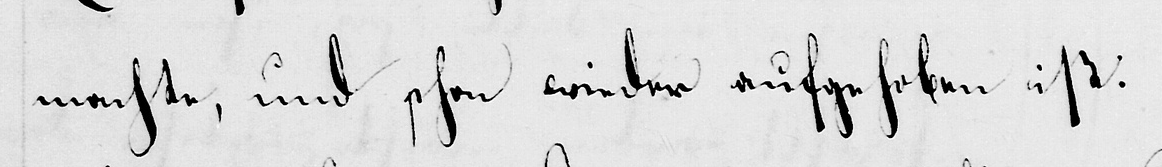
machte, und schon wieder aufgehoben ist.
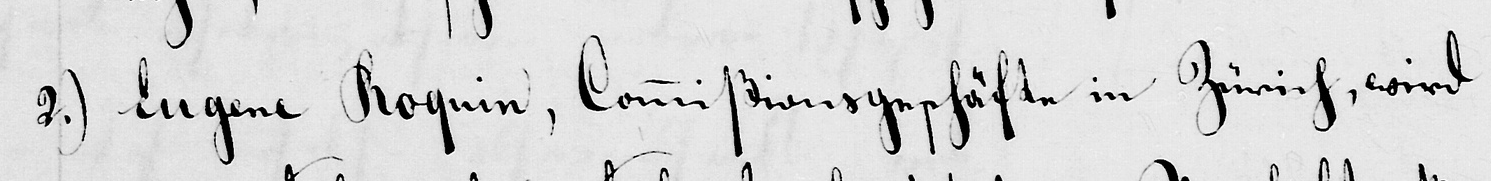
2.) Eugene Koquin, Commißionsgeschäfte in Zürich, wird
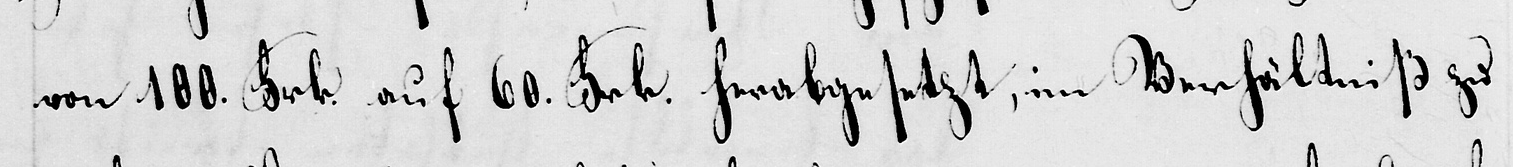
von 100. Frk. auf 60. Frk. herabgesetzt, im Verhältniß zu
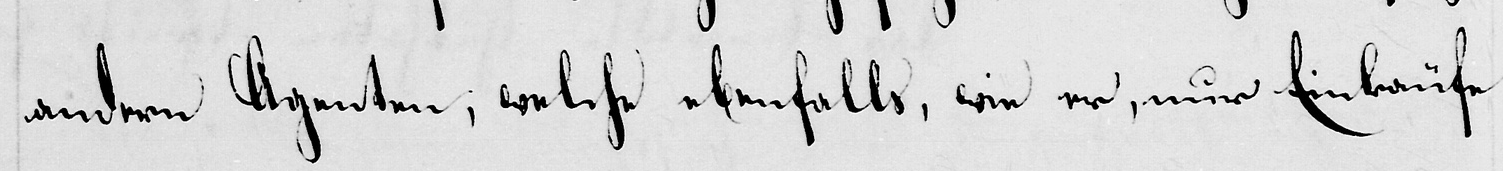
andern Agenten, welche ebenfalls, wie er, nur Einkäufe
